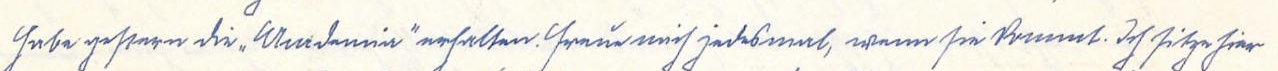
Habe gestern die „Academica“ erhalten. Freue mich jedesmal, wenn sie kommt. Ich sitze hier
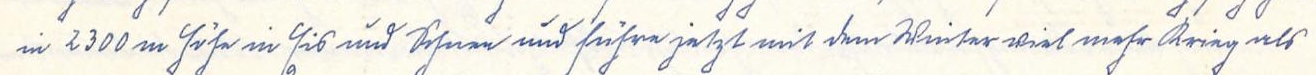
in 2300 m Höhe in Eis und Schnee und führe jetzt mit dem Winter viel mehr Krieg als
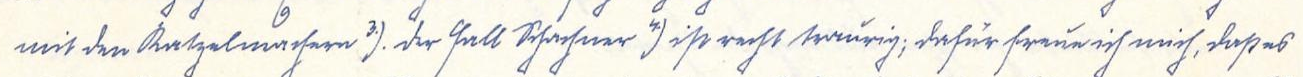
mit den Katzelmachern 3). Der Fall Schachner ist recht traurig; dafür freue ich mich, daß es
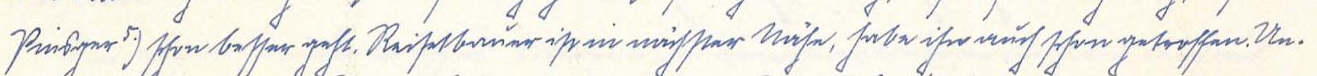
Pinsger (?) schon besser geht. Reiselbauer ist in nächster Nähe, habe ihn auch schon getroffen. Un-
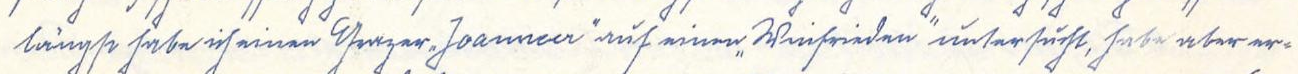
längst habe ich einen Grazer „Joaneer“ auf einen „Winfrieden“ untersucht, habe aber er-
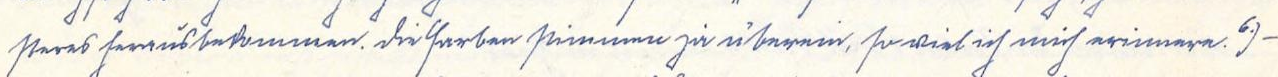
sterer herausbekommen. Die Farben stimmen ja überein, soviel ich mich erinnere. 6)-
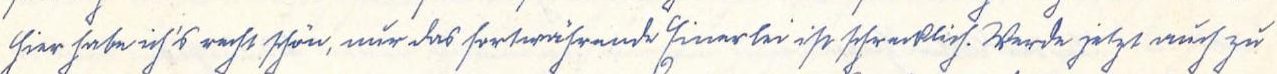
Hier habe ich‘s recht schön, nur das fortwährende Einerlei ist schrecklich. Werde jetzt auch zu
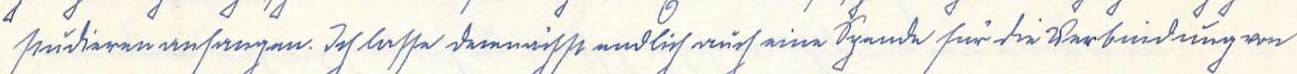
studieren anfangen. Ich lasse demnächst endlich auch eine Spende für die Verbindung von
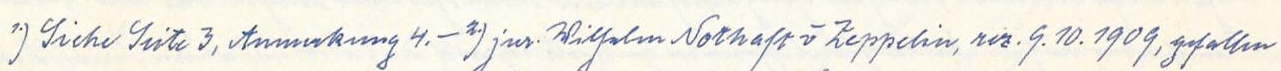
1) Siehe Seite 3, Anmerkung 4. – 2) iur. Wilhelm Nothaft v/o Zeppelin, rez. 9.10. 1909, gefallen
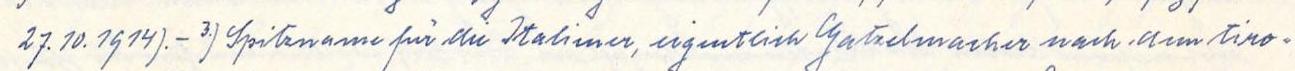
27. 10 1940.- 3)Spitzname für alle Italiener, eigentlich Gatzelmacher nach dem tiro-
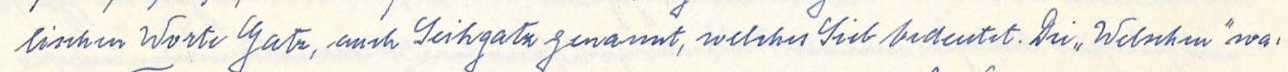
lischen Worte Gatz, auch Seichgatz genannt, welches Sieb bedeutet. Die „Walschen“ wa-
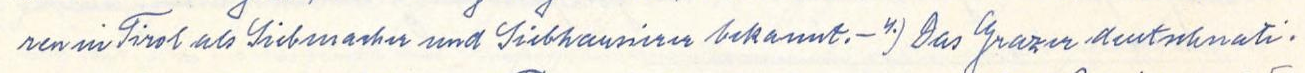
ren in Tirol als Siebmacher und Siebhausierer bekannt. 4) Das Grazer deutschnati-
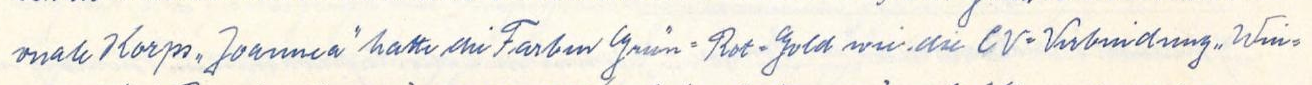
onale Korps „Johannea“ hatte die Farben Grün-Rot-Gold und die CV-Verbindung „Win-
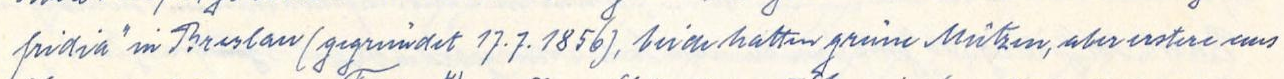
fridia“ in Breslau (gegründet 17.7.1856), beide hatten grüne Mützen, aber erstere aus
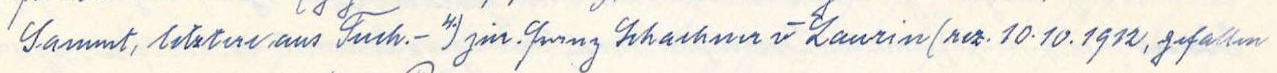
Sammt, letztere aus Tuch – 4) iur. Franz Schachna v/o Laurin ( rez. 10.10.1912 gefallen
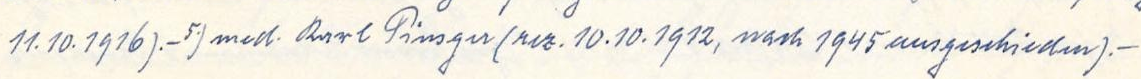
11.10.1916) - und med. Karl Pinsger (rez. 10.10.1912, nach 1945 ausgeschieden)-
